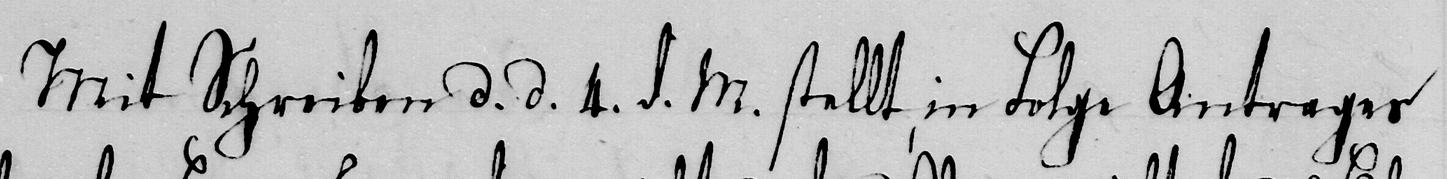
Mit Schreiben d. d. 4. d. M. stellt, in Folge Antrages
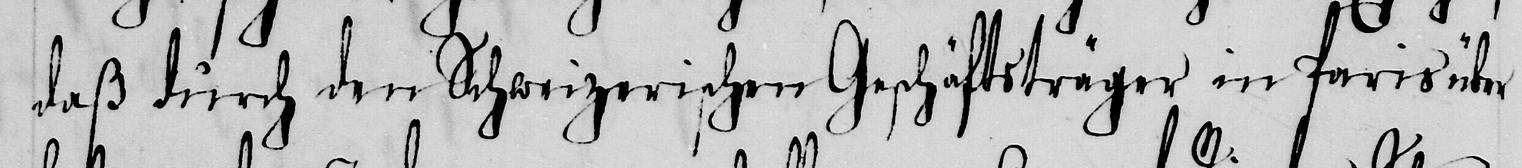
daß durch den Schweizerischen Geschäftsträger in Paris über
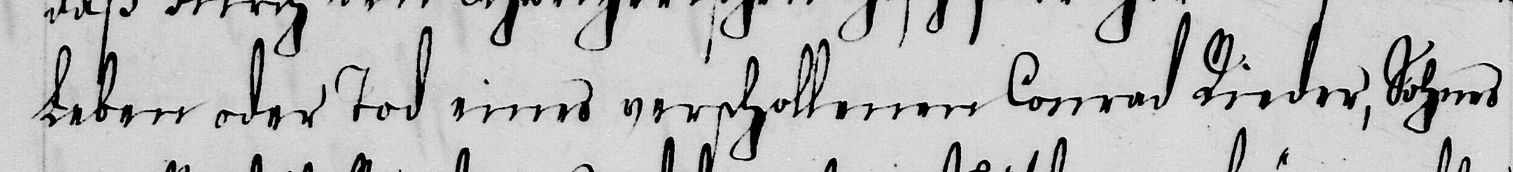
Leben oder Tod eines verschollenen Conrad Rieder, Sohnes
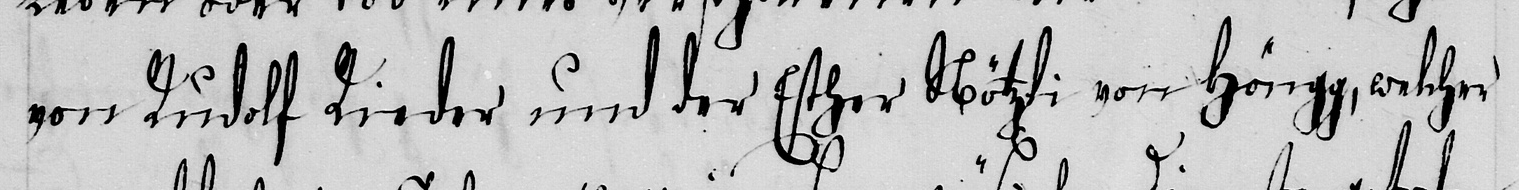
von Rudolf Rieder und der Escher Nötzli von Höngg, welcher
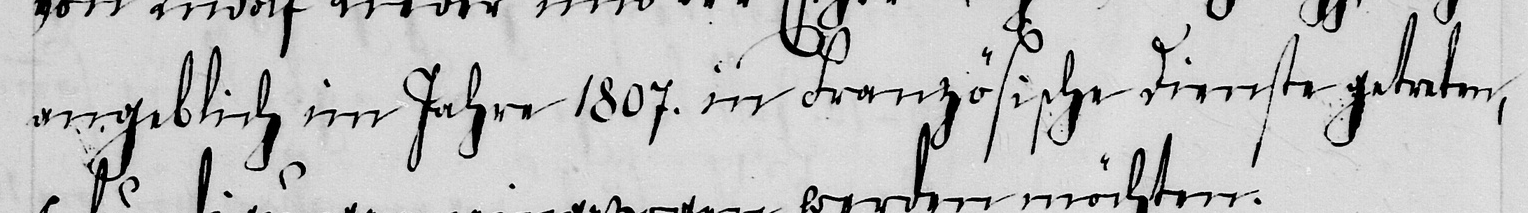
angeblich im Jahre 1807. im Französischen Dienste getreten,
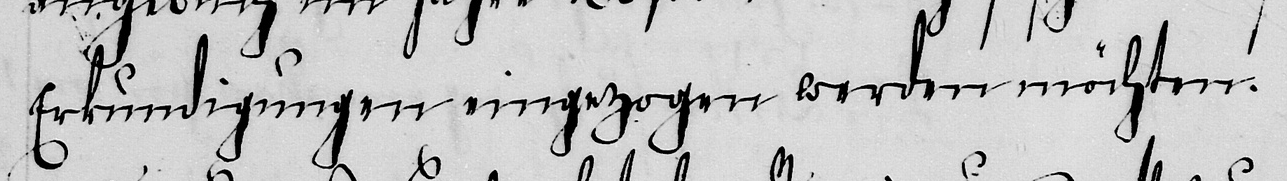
Erkundigungen eingezogen werden möchten.
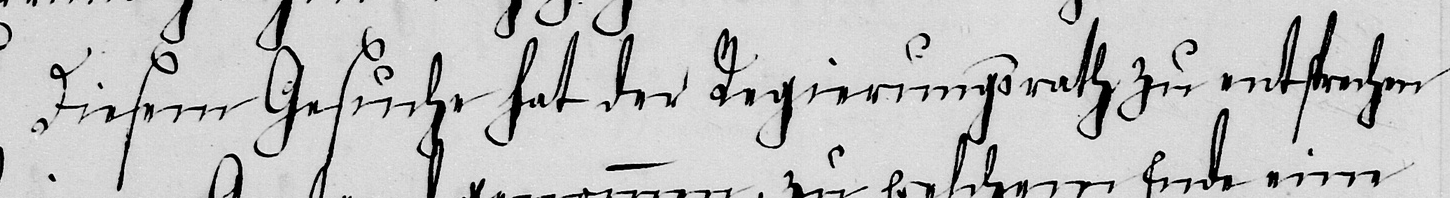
Diesem Gesuche hat der Regierungsrath zu entsprechen
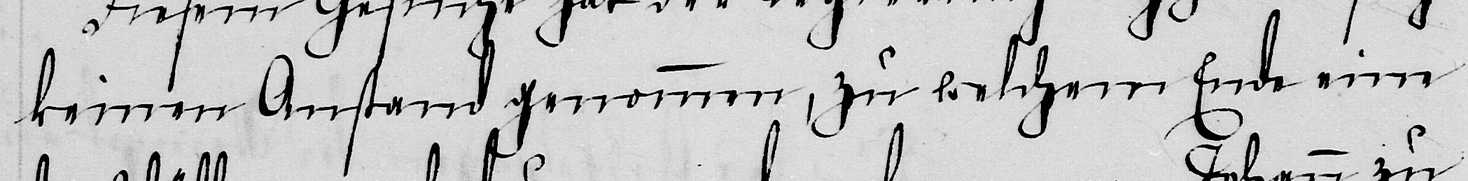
keinen Anstand genommen, zu welchem Ende eine
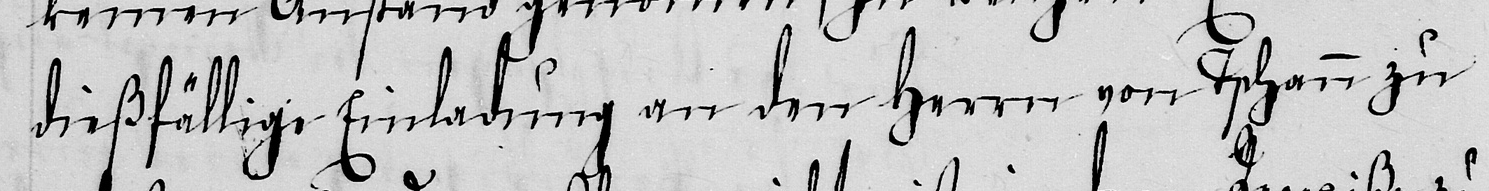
dießfällige Einladung an den Herrn von Tschann zu
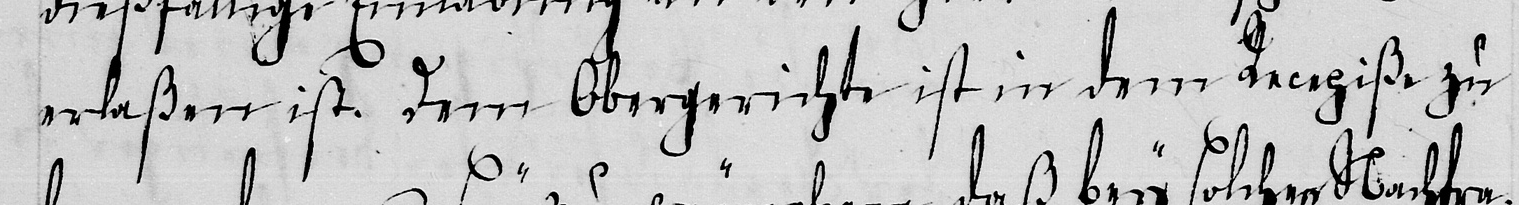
erlaßen ist. Dem Obergerichte ist in dem Recepiße zu
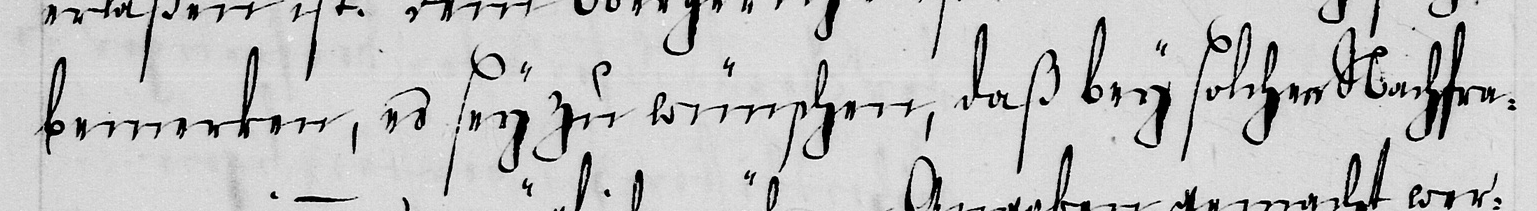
bemerken, es sey zu wünschen, daß bey solchen Nachfra¬
